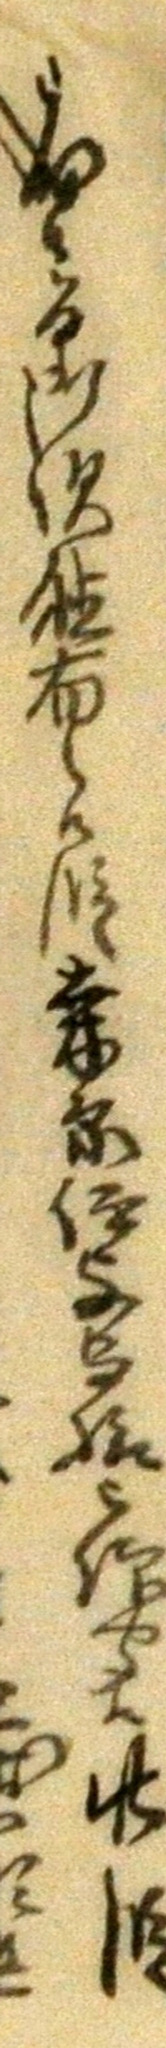被成候旨御吹聴有之候段桑原伊与守様被仰聞候此段
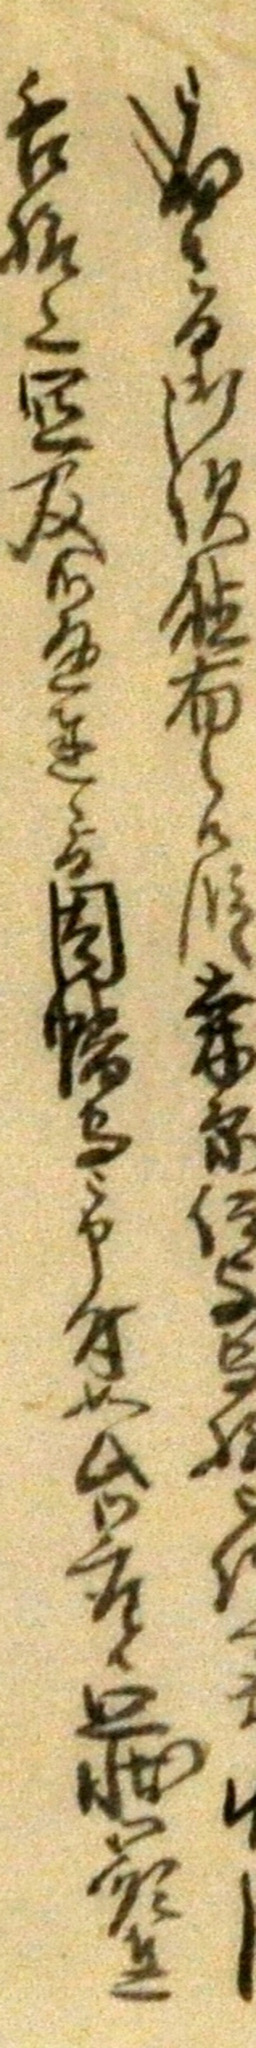各様上宜及御通達候旨因幡守被申付如此御座候廻状御順達
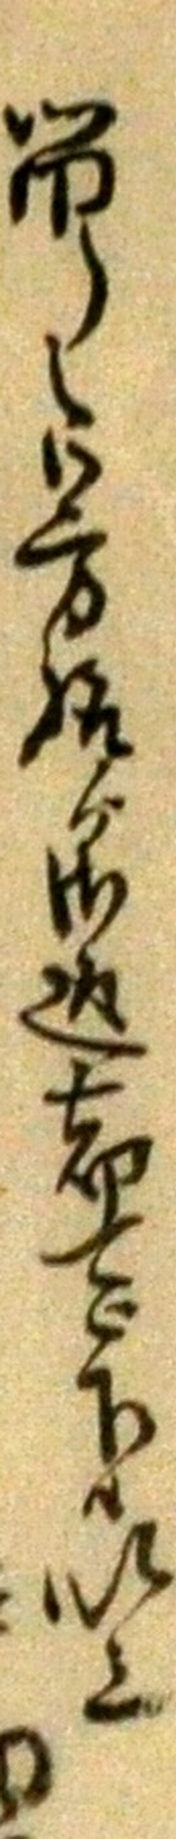留り之御方様ゟ御返却可被下候以上
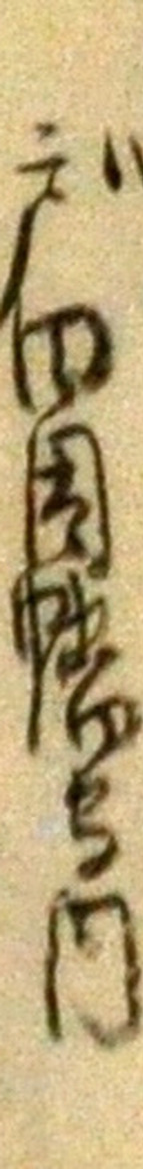戸田因幡守内
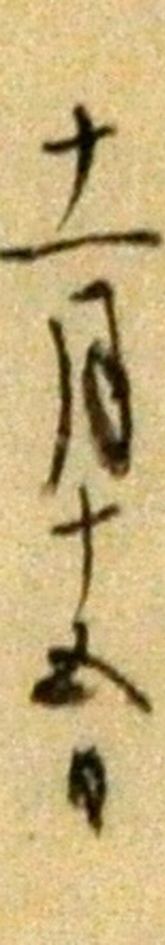十一月十五日
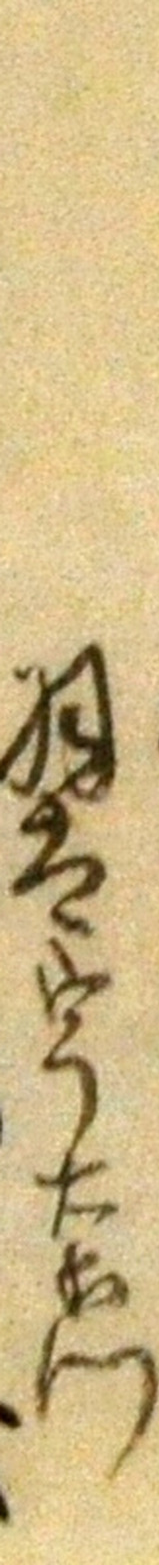羽太宇右衛門
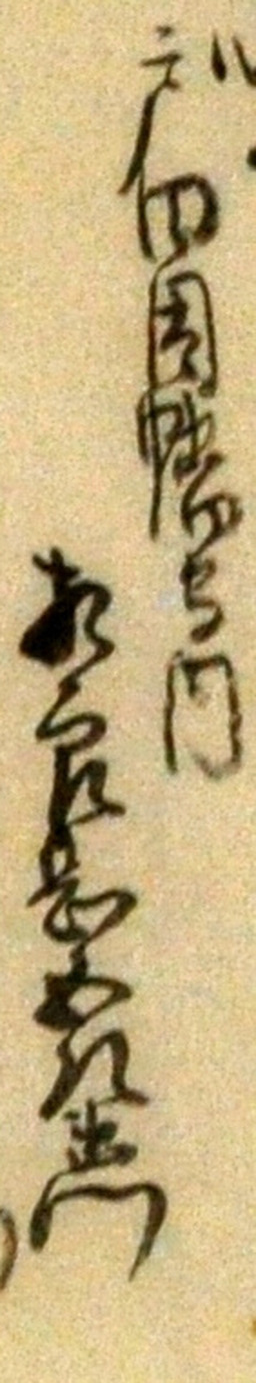相良甚五左衛門
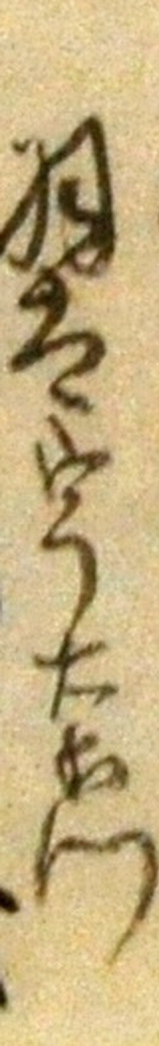羽太宇右衛門
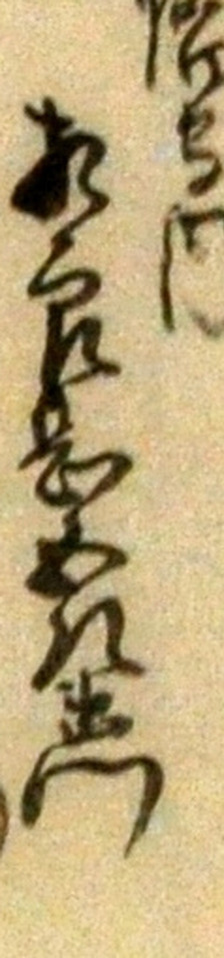相良甚五左衛門
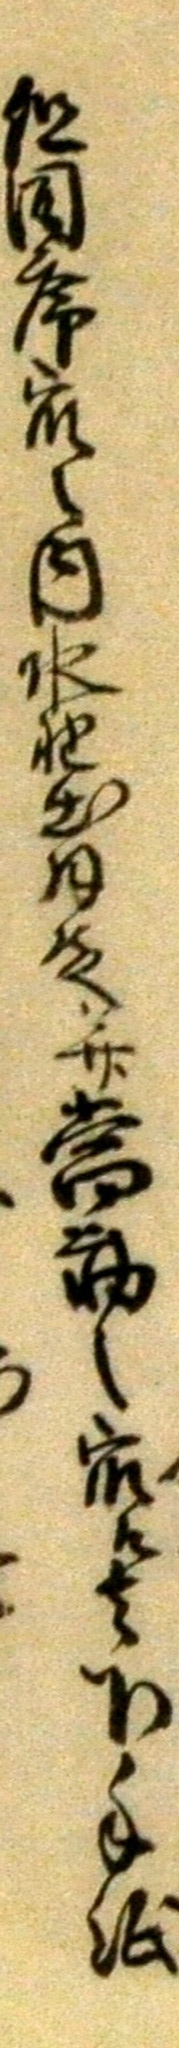但同席衆之内水野出羽殿并当勤之衆えは下手紙
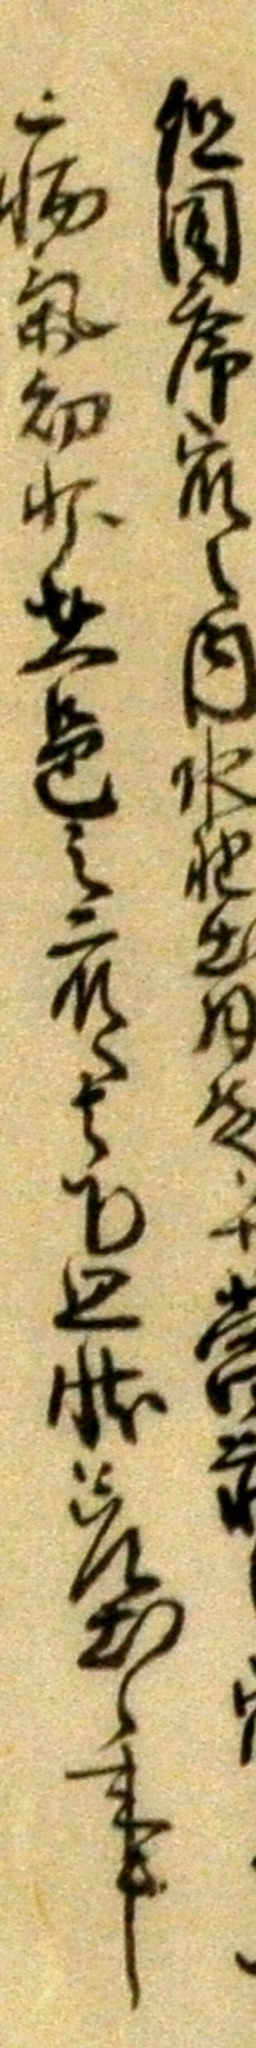病気幼少在邑之衆へは下廻状差出候事

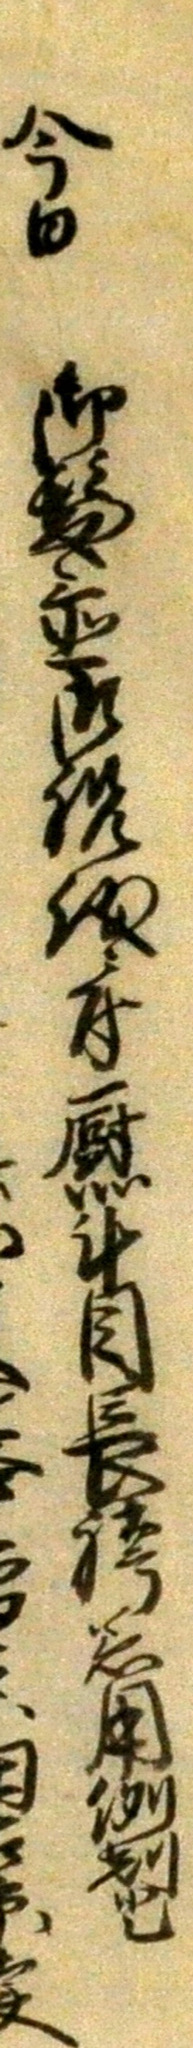一今日御髪置御祝儀ニ付熨斗目長袴着用例刻登
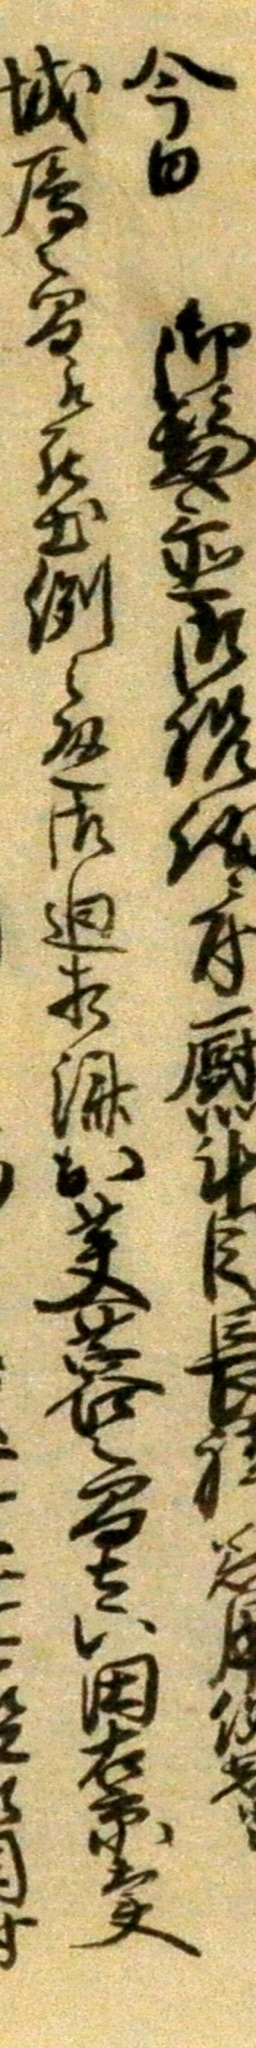城雁之間え罷出例之通御廻相済於芙蓉之間真田右京大夫
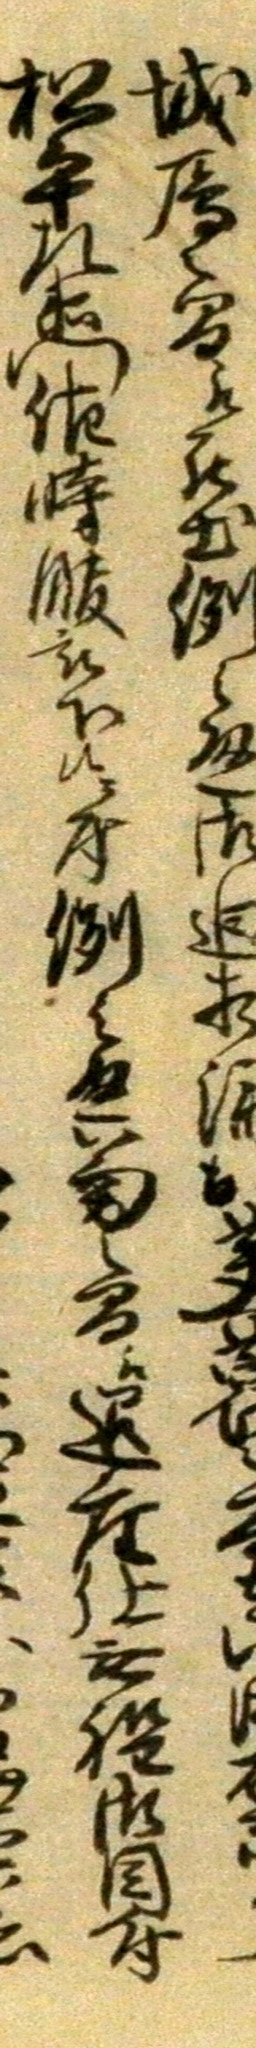松平左衛門佐時服被下候ニ付例之通菊之間え退座仕無程御目付
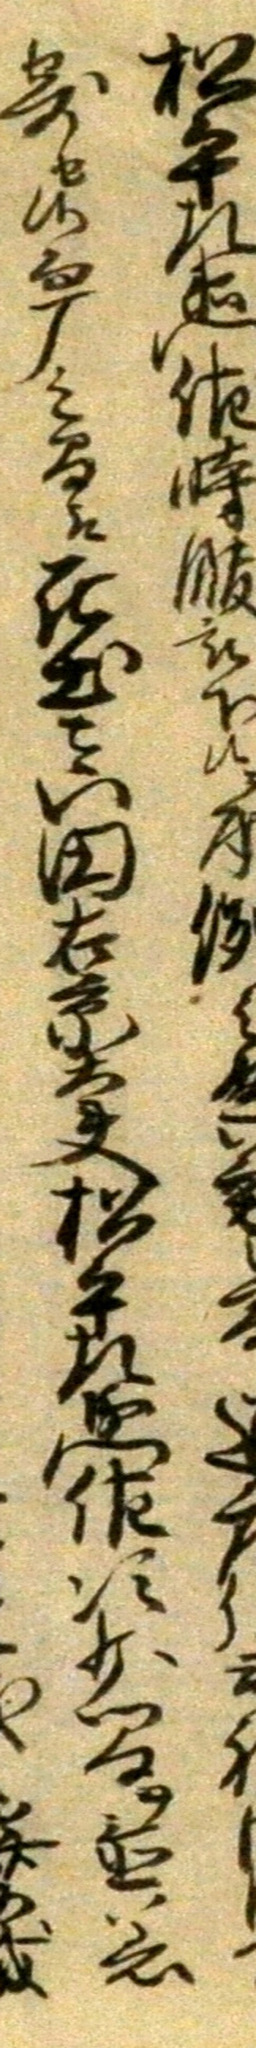寄セ候而雁之間え罷出真田右京大夫松平左衛門佐次少間ヲ置着
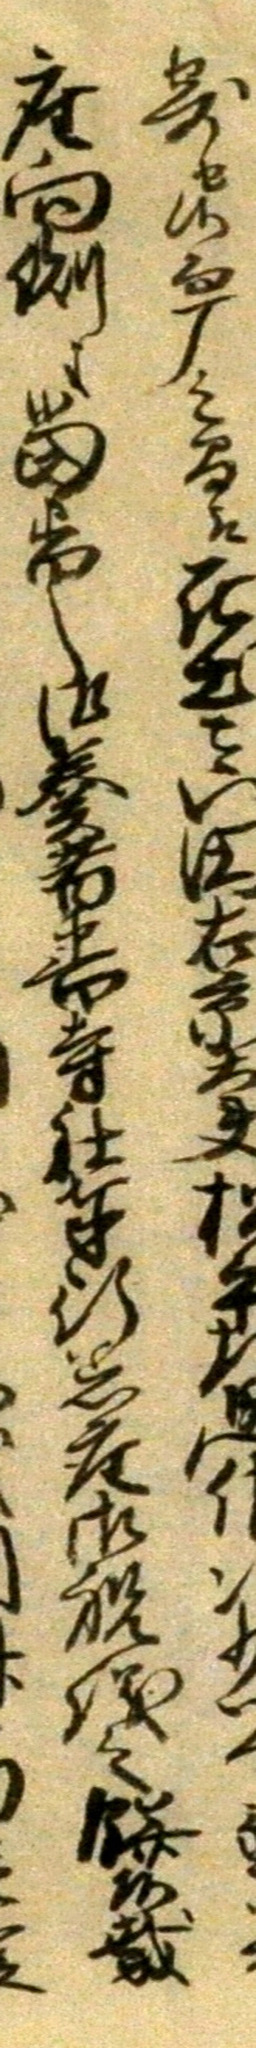座向側に留番之御奏者番寺社奉行着座御祝儀之餅頂戴
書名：若君様御色直御祝儀ノ節ノ留
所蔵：伊那市立高遠町図書館・合同会社AMANE
